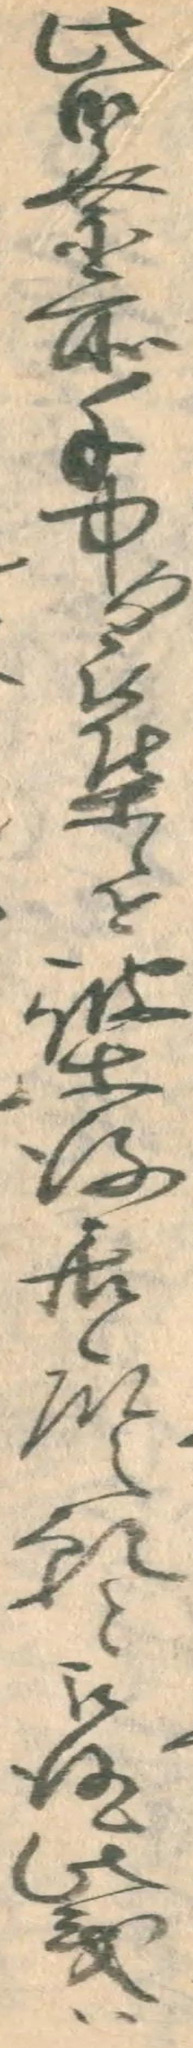此御祭前手中ゟ被集候を彼木役居候故之願と被存候此義ハ
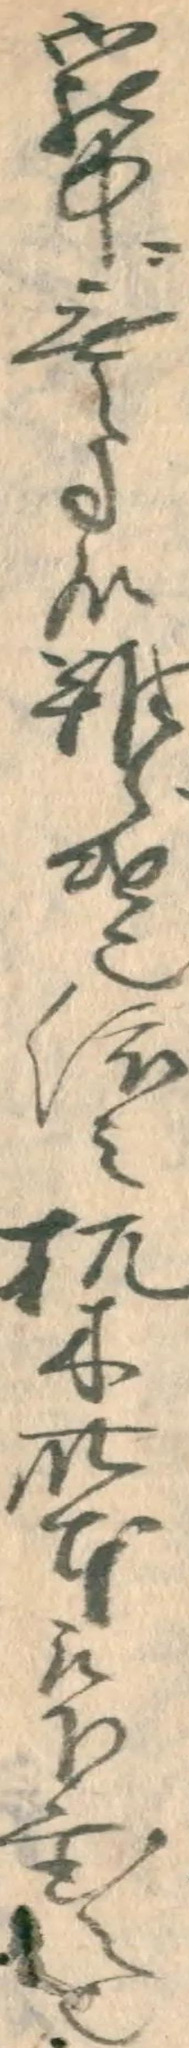御社中ニ無之事故難被遣也依之杭木卅本被下置之也
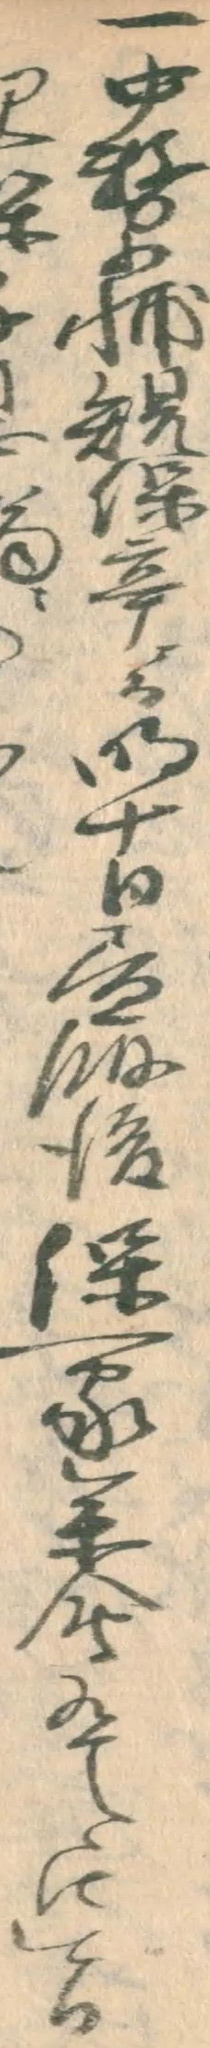一中務少輔規保亭ニ而明十日昼飯後保一家参会有之候由今日
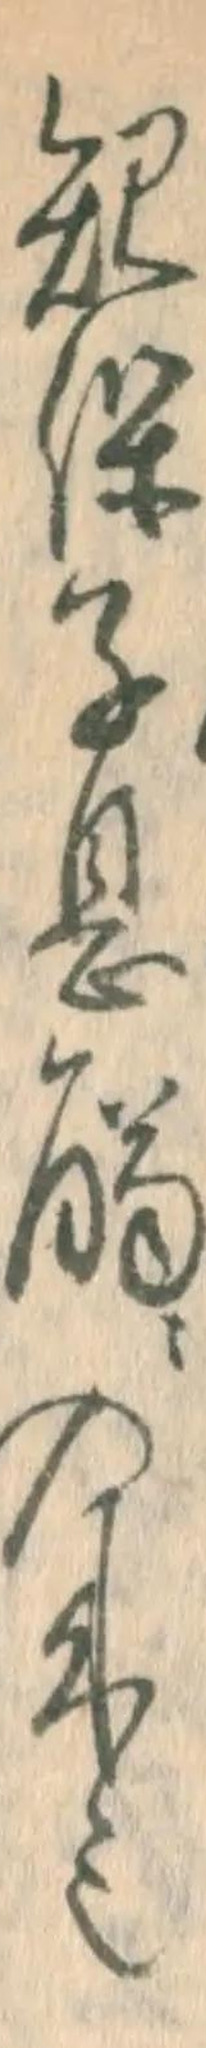規保子息触ニ入来候也
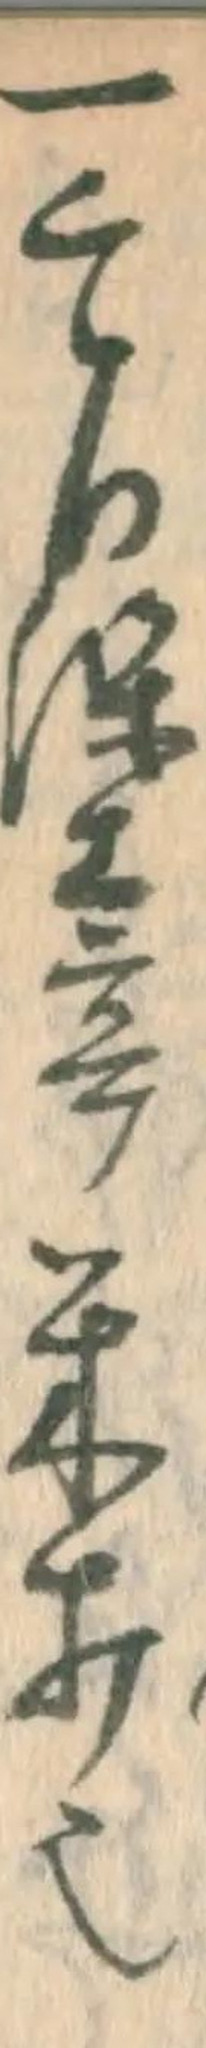一今日保土亭米打也
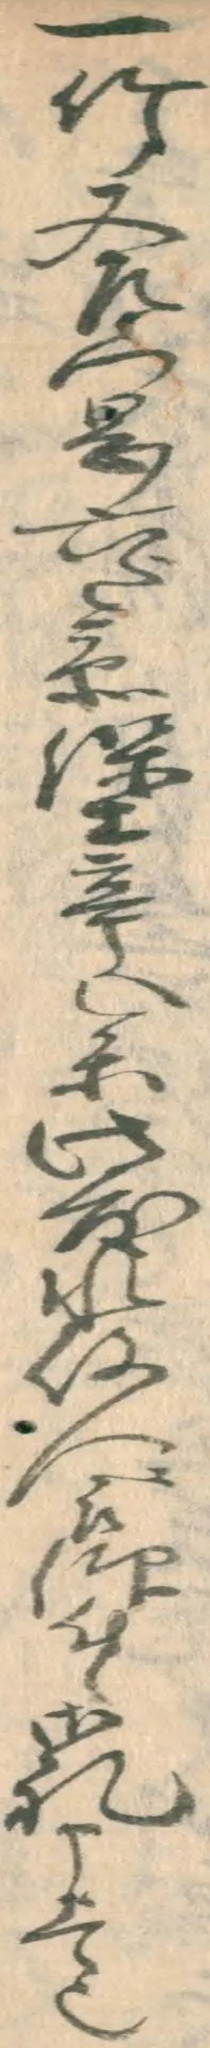一竹ノ又左衛門岡ノ六郎兵衛保土亭へ参此度水役人ニ被仰付候御礼申上候也
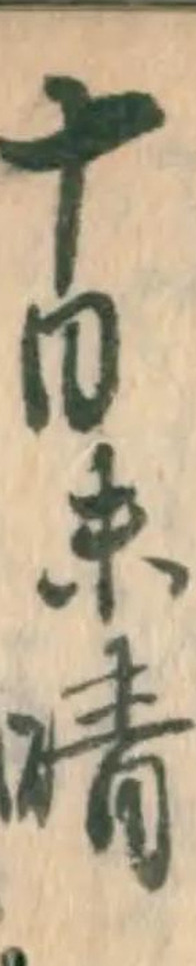十日未晴
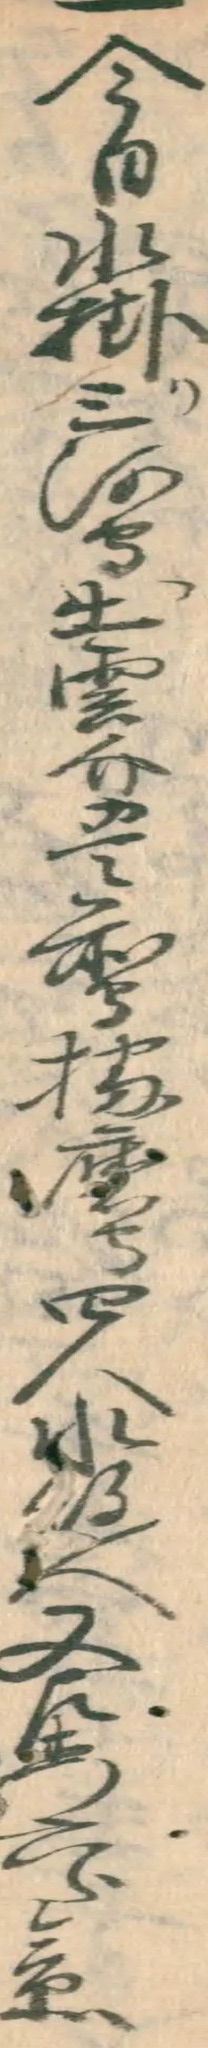一今日水掛り三河守出雲介豊前守播磨守四人水役人又左衛門六郎兵衛
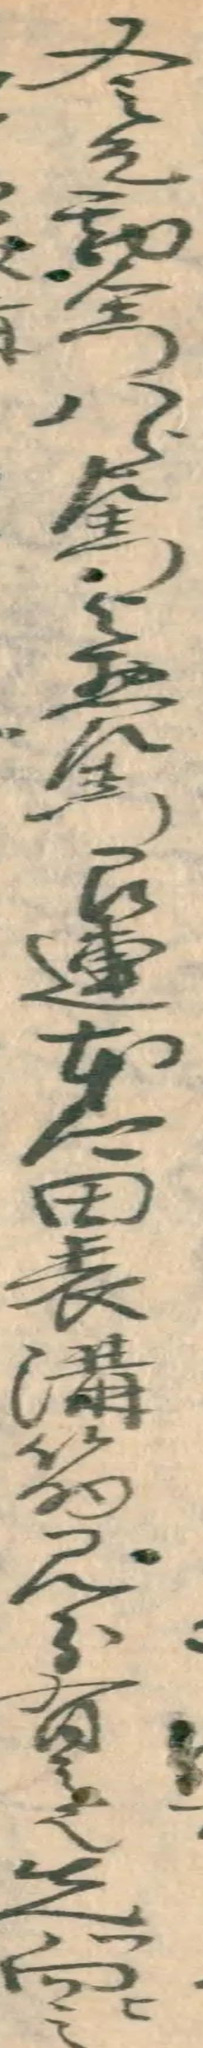又之允勘右衛門八郎左衛門与惣左衛門召連本郷田表溝筋見分有之也先ツ向ヒ之
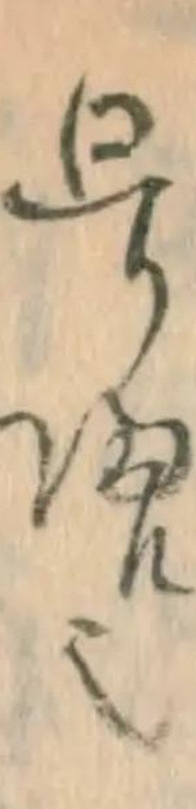廻り帰ル也
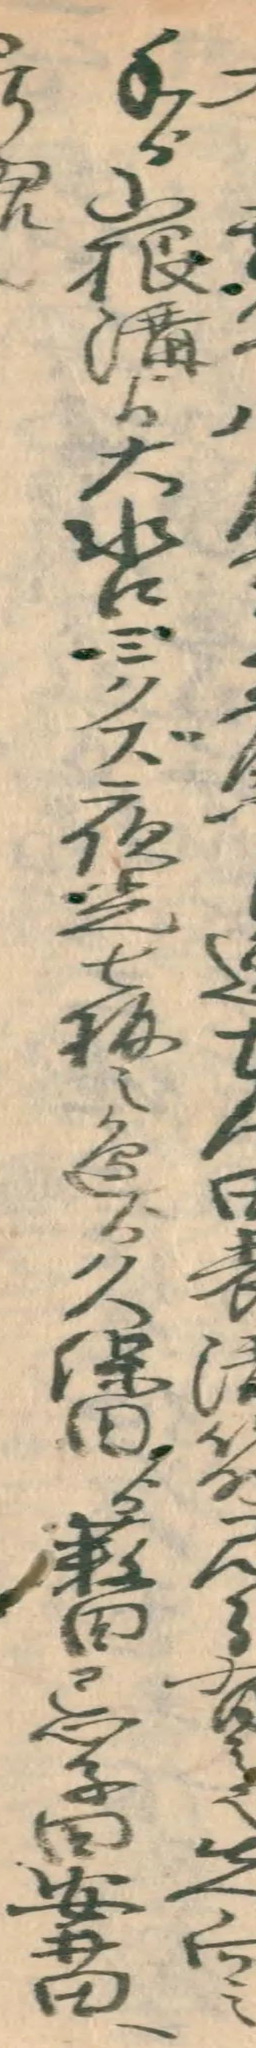手ゟ山根溝ゟ大水口ミクズ夜光七板之辺ゟ久保田ゟ薮田忌子田安井田へ
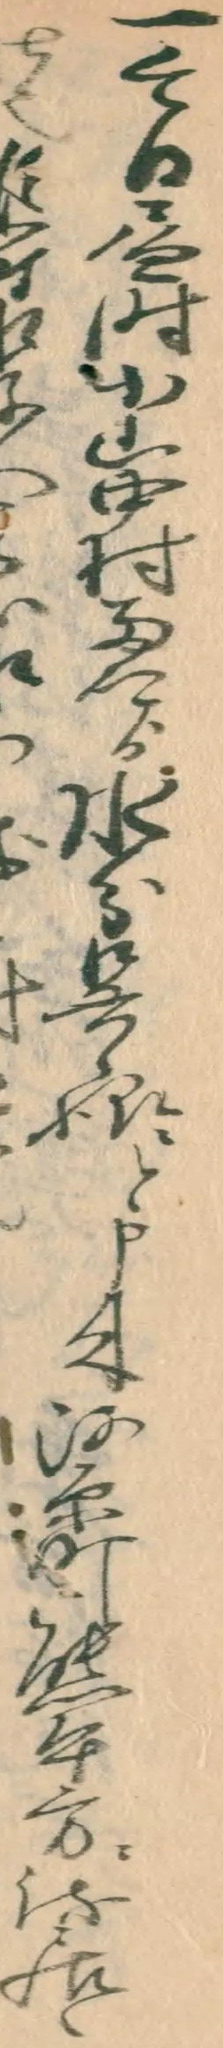一今日昼時小山中村両郷ゟ水分呉候様ニと申来河原町熊本方ニ待居候
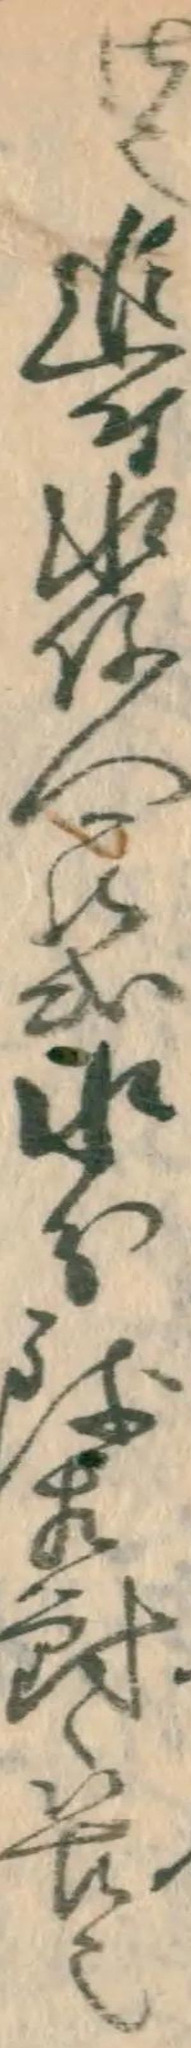由也追付水役人罷出水分致相対候筈也
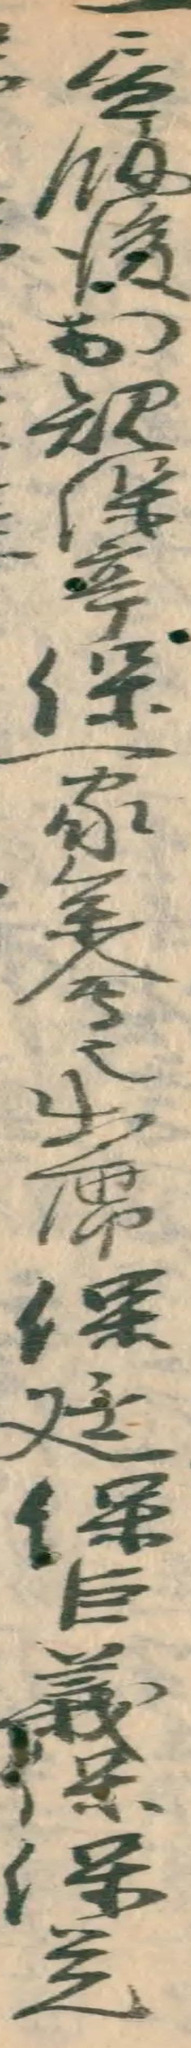一昼飯後於規保亭保一家参会也出席保延保臣義保保覚
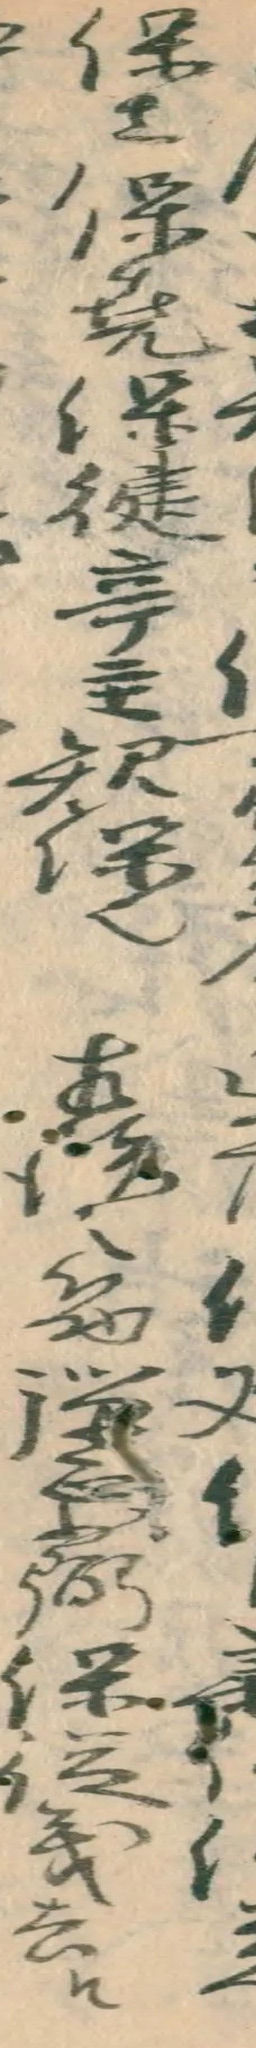保土保堯保健亭主規保也相談之筋弾正少弼保従義去ル
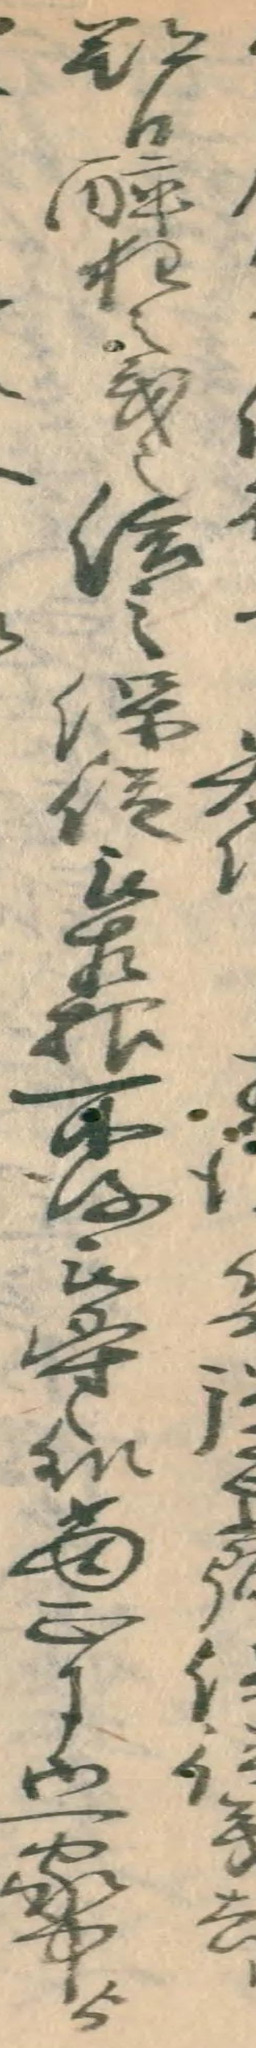朔日酔狂之義也依之保従被相招所存被尋候処当正月御一家中ゟ
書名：賀茂社記録. 第58冊
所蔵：国立国会図書館 National Diet Library, JAPAN
